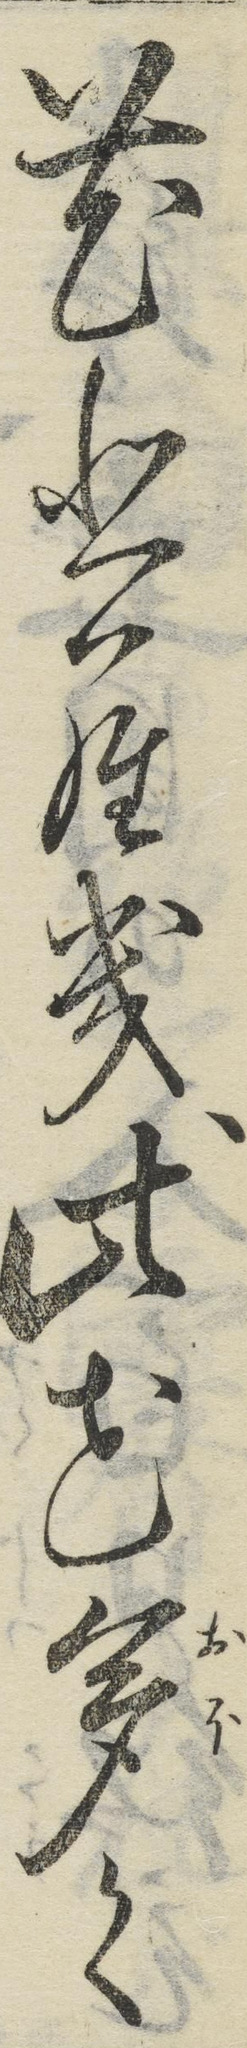花ひらき、此花多く
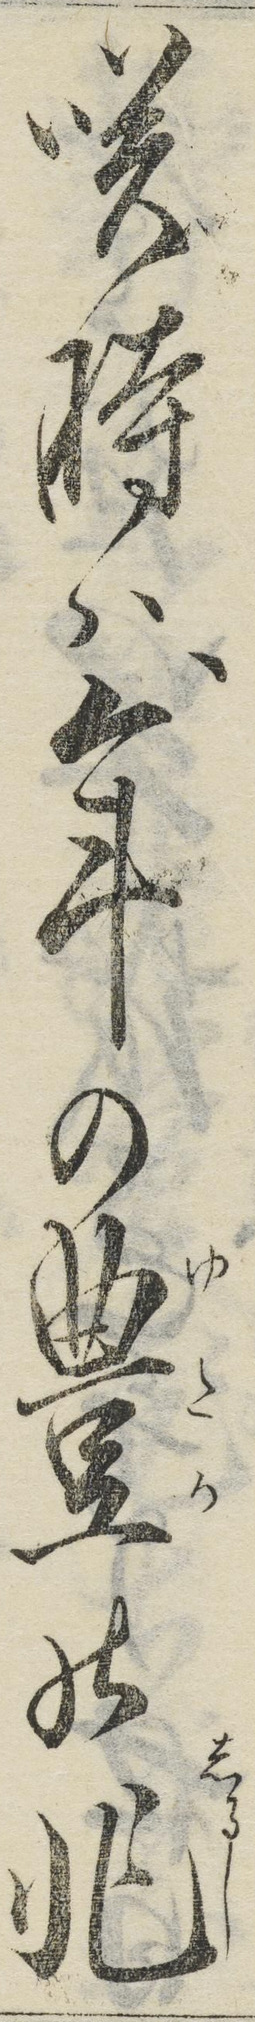咲時は、年の豊の兆
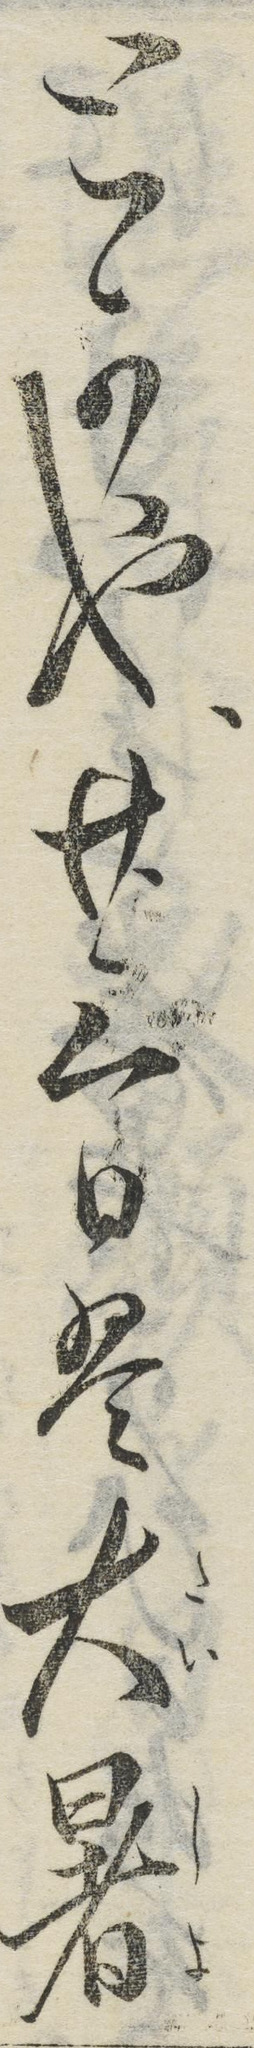とかや、廿三日は大暑
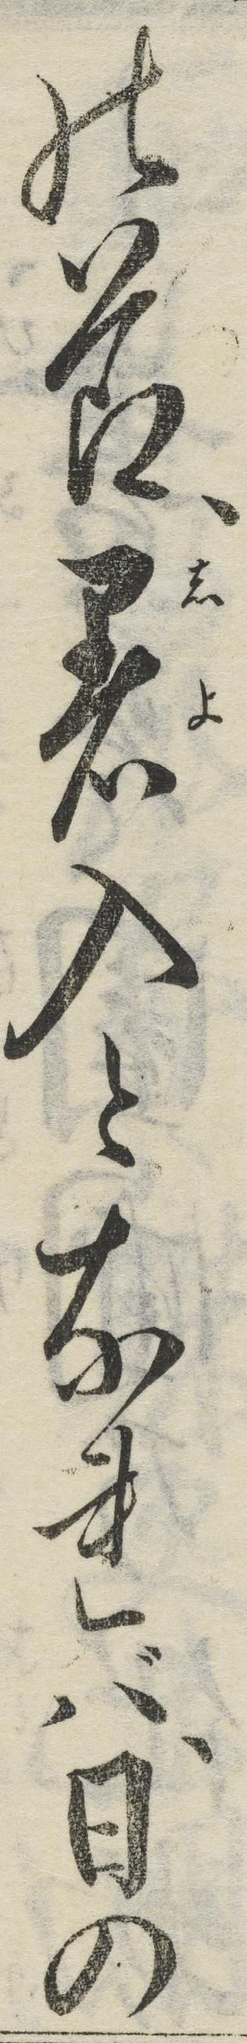の節、暑入となれば、日の
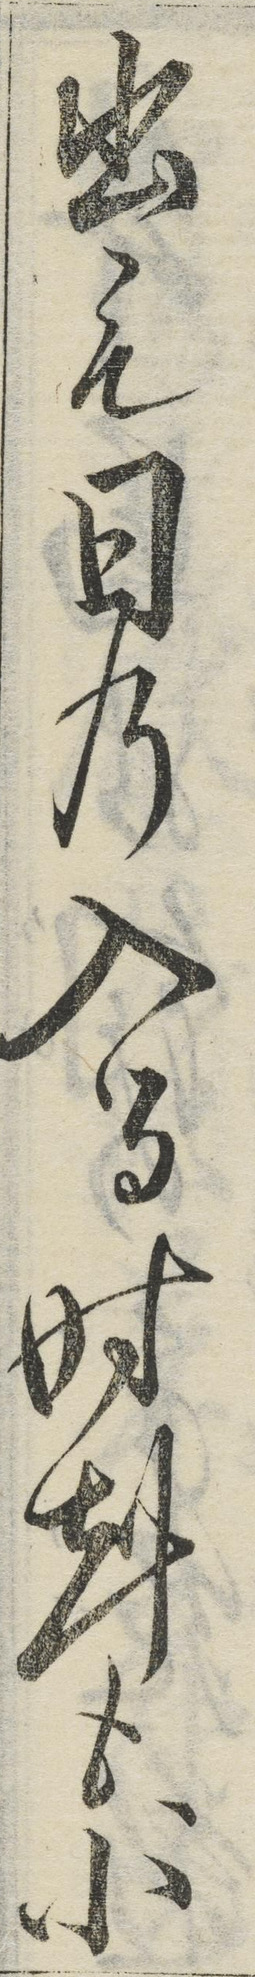出も日の入る時刻も、小
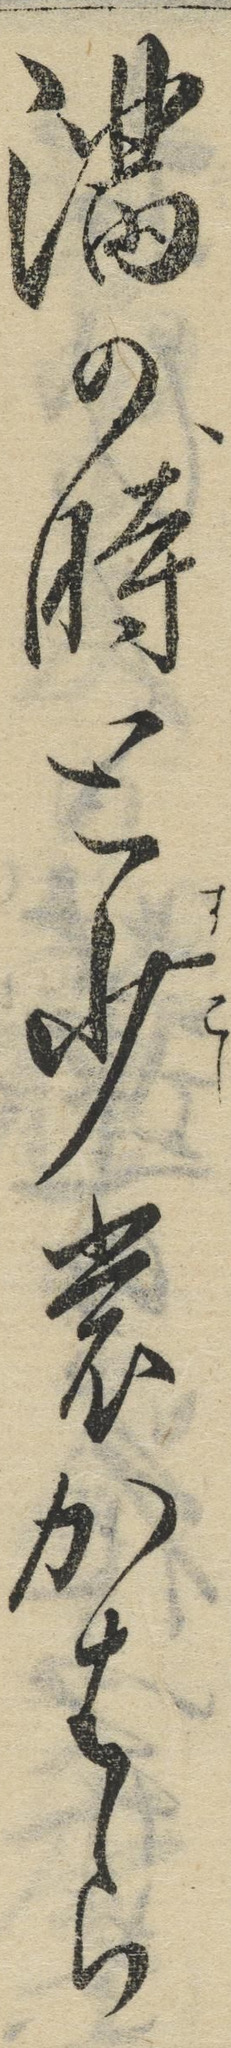満の、時と少もかはら
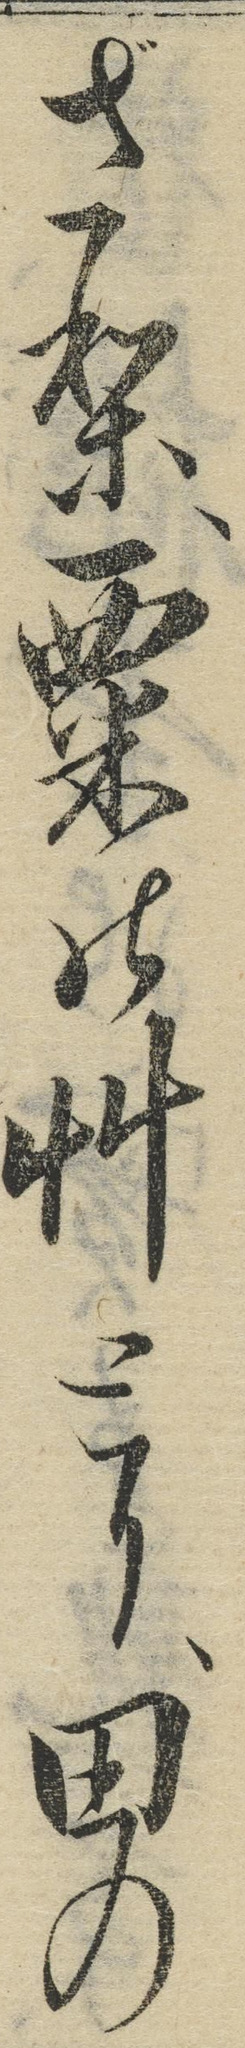ざり、粟の艸とり、田の
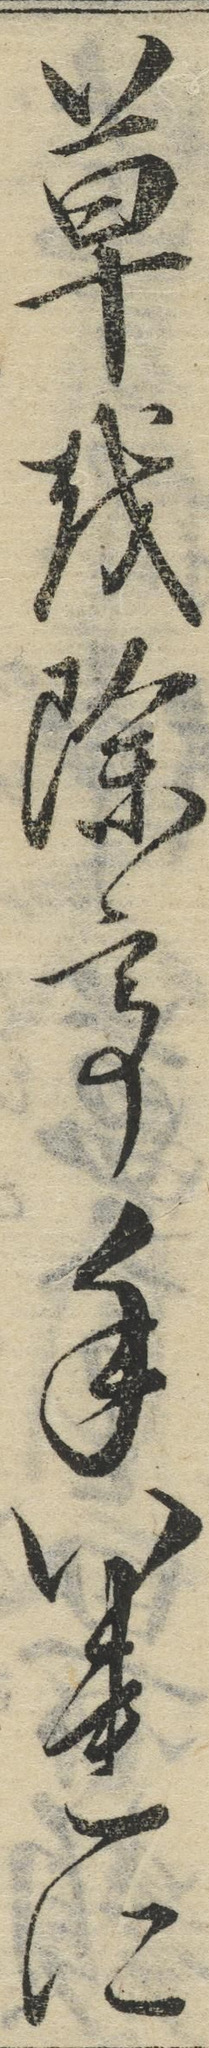草を、除て手いれに
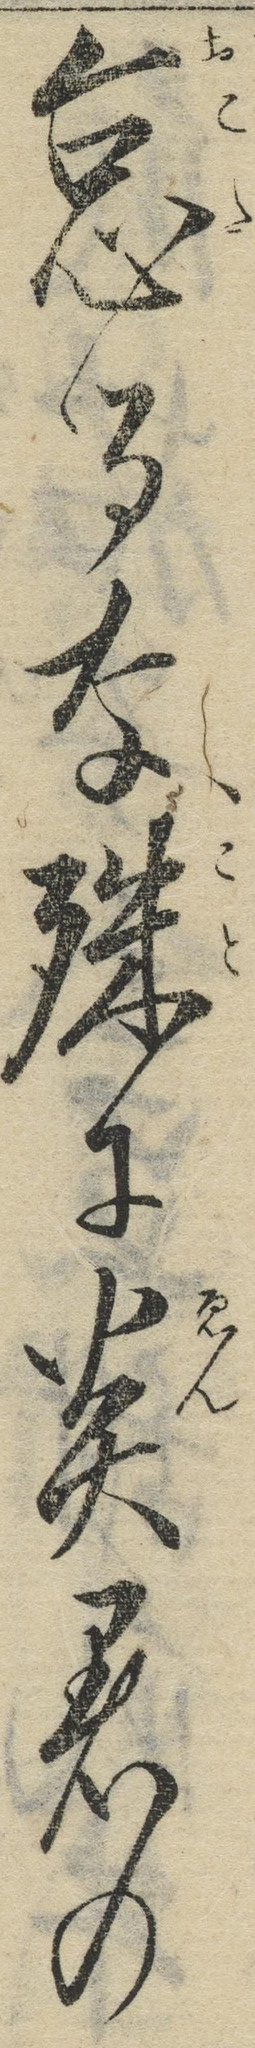怠るな、殊に炎暑の
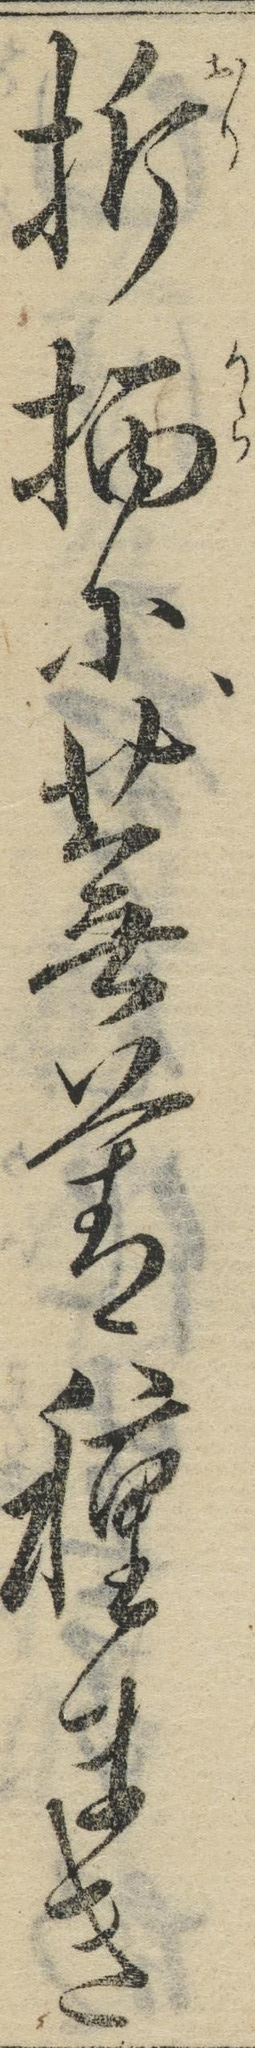折柄に、蕪菁？種まき

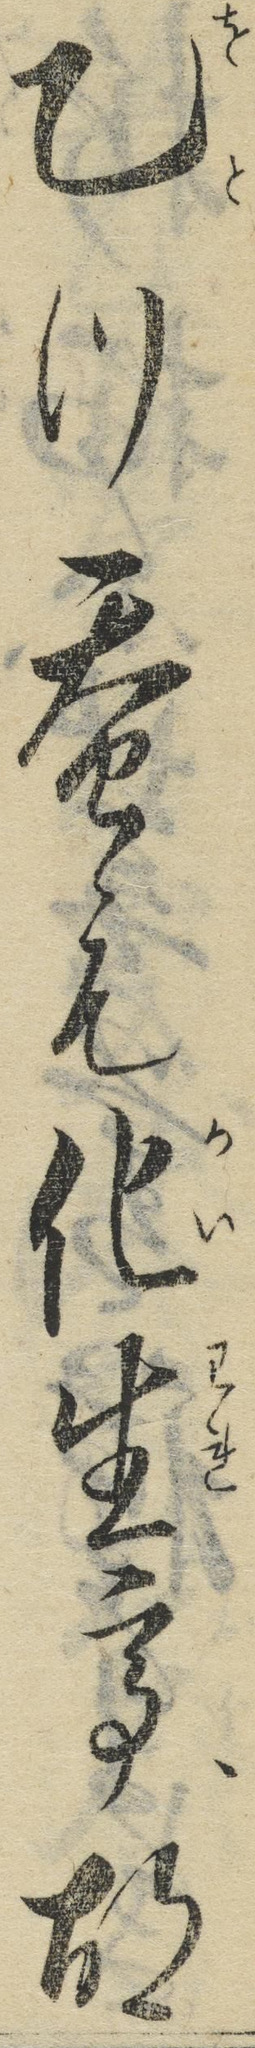乙川蚕も化生て、胡
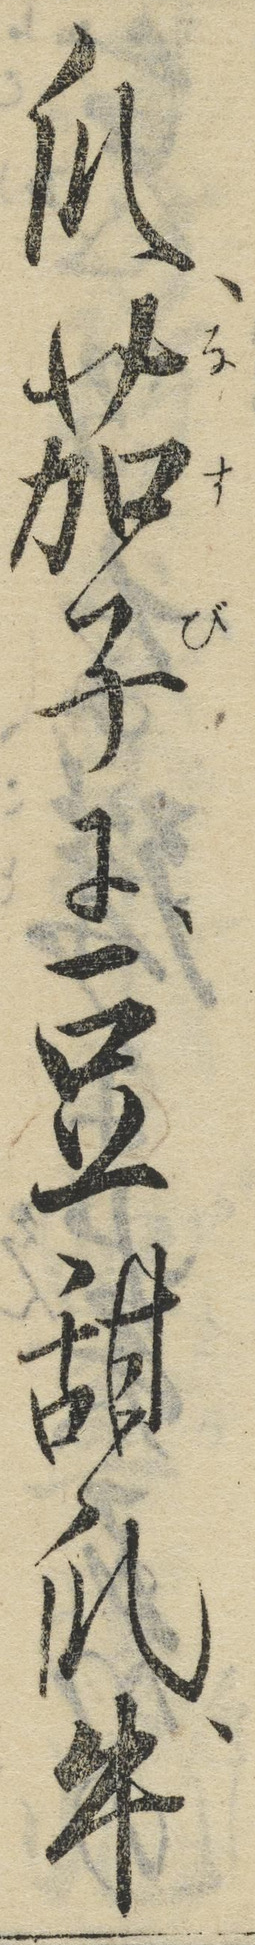瓜、茄子に、豆甜瓜、牛
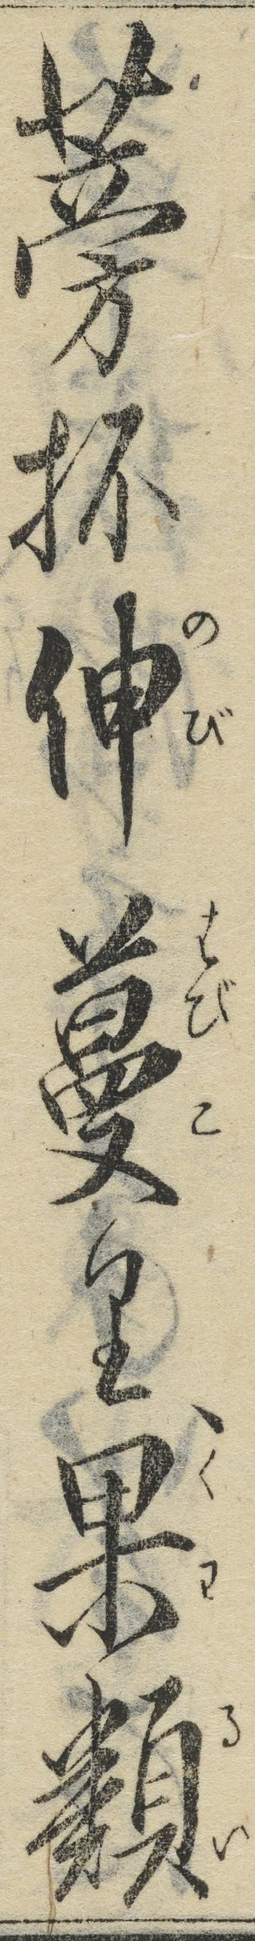蒡杯伸蔓り、果類
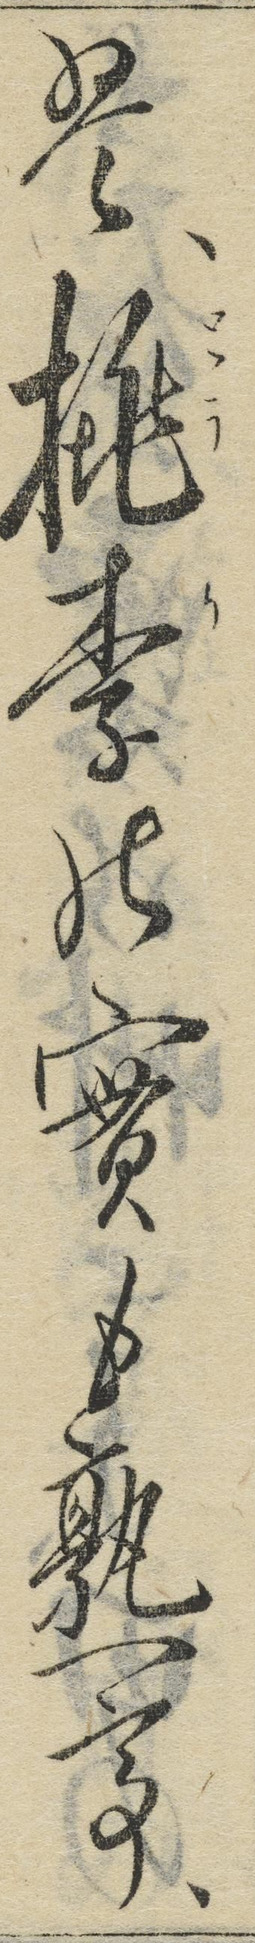は、桃李の実も熟て、
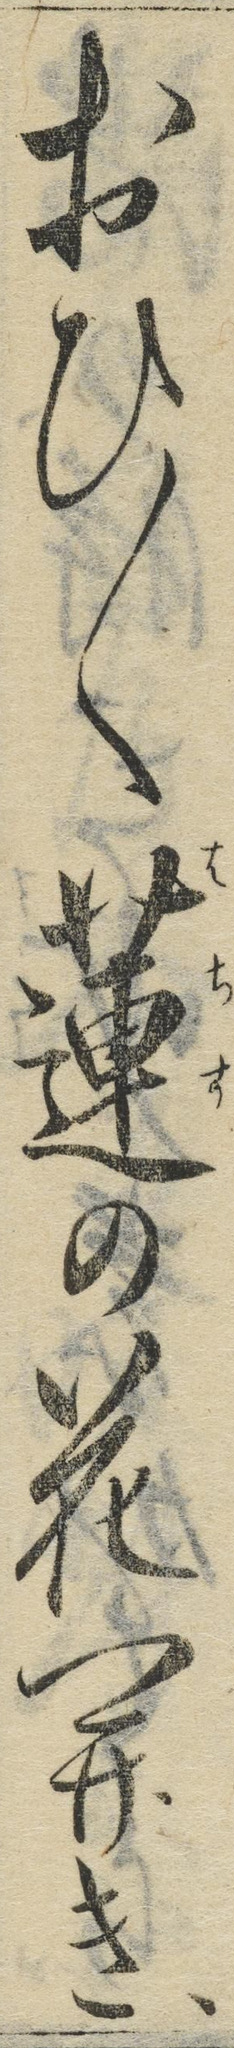おひ〳〵蓮の花開き、
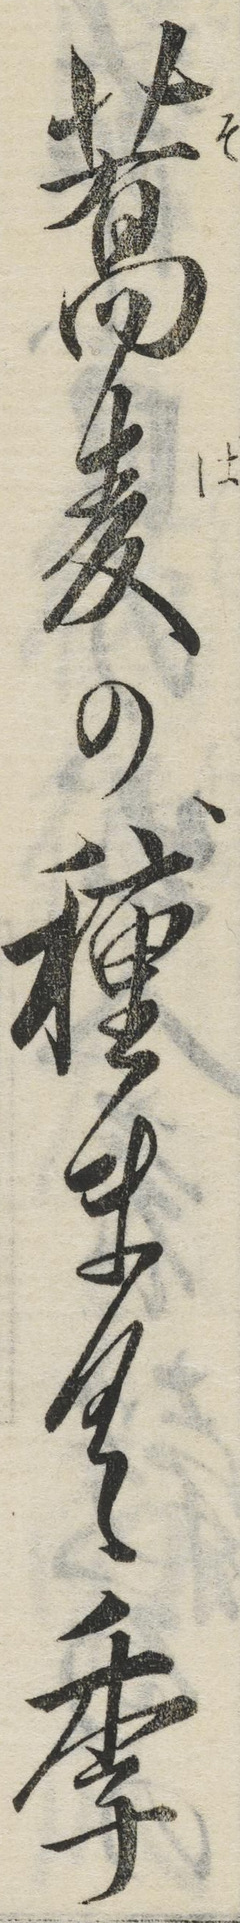蕎麦の、種まく季
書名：暦日往来　單
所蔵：東京大学地震研究所図書室 Earthquake Research Institute Library, The University of Tokyo, JAPAN
